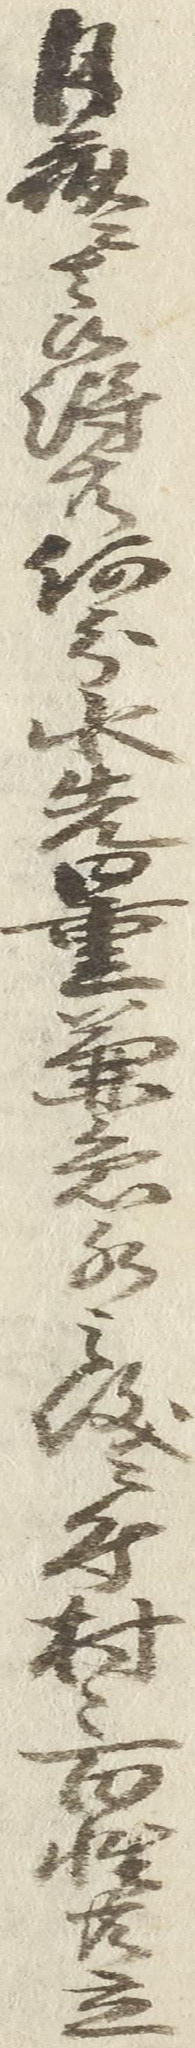月夜二は候得共何分水先量兼急水之儀二付村々百姓共立
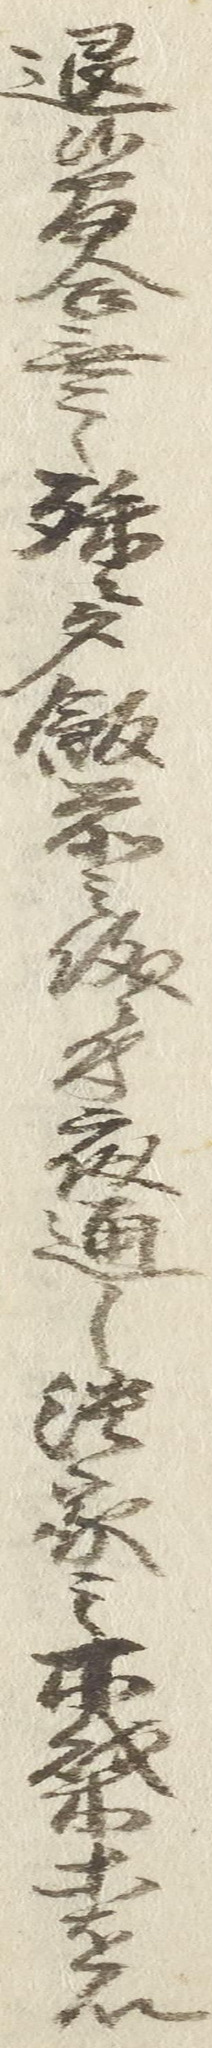退候間合無之殊二夕飯前之儀二付夜通潰家之木財木等を以
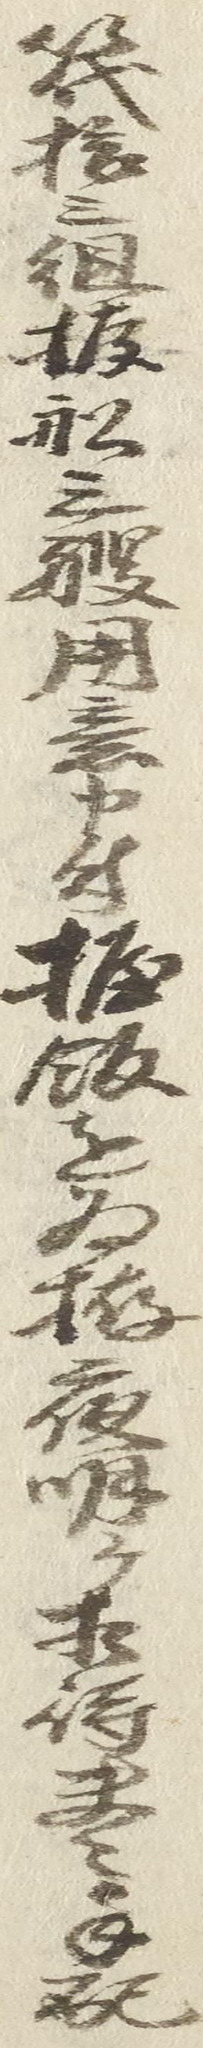筏様三組拵船三艘用意申付携飯を為拵夜明ヶ相待夫々手配
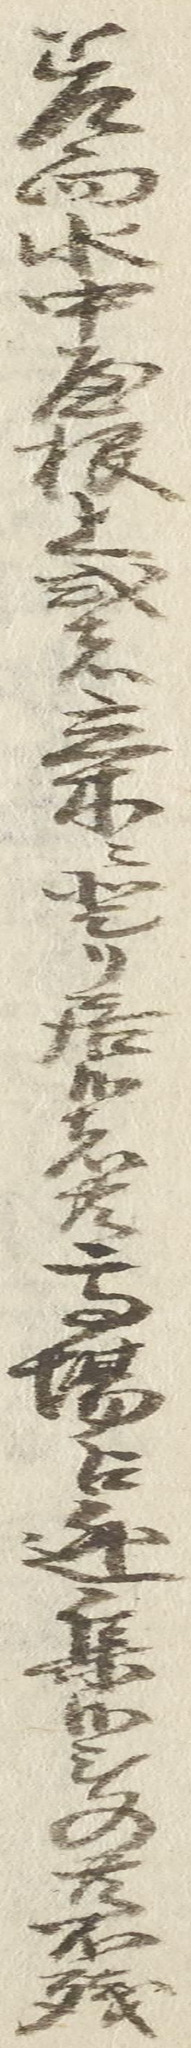差向水中屋根上或は立木二登り居候者共高場江逃集候もの共不残
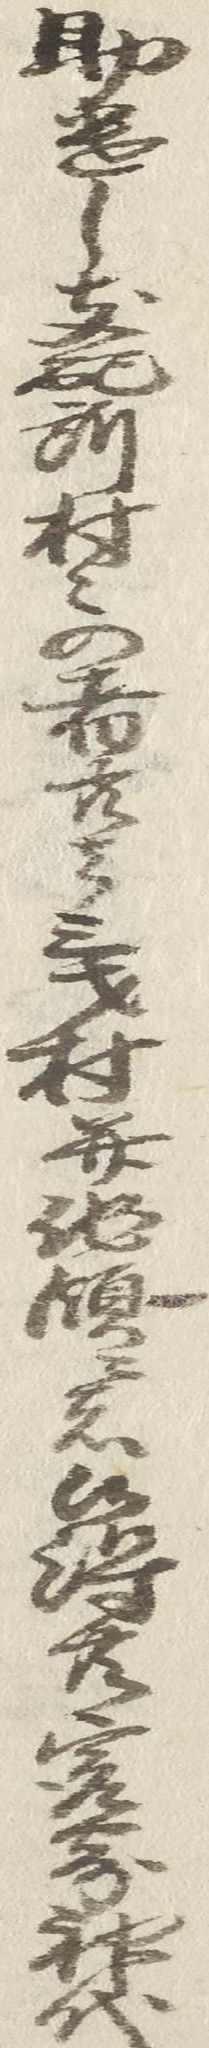助遣し支配所村々之者共は三才村并他領二は候得共最寄神代
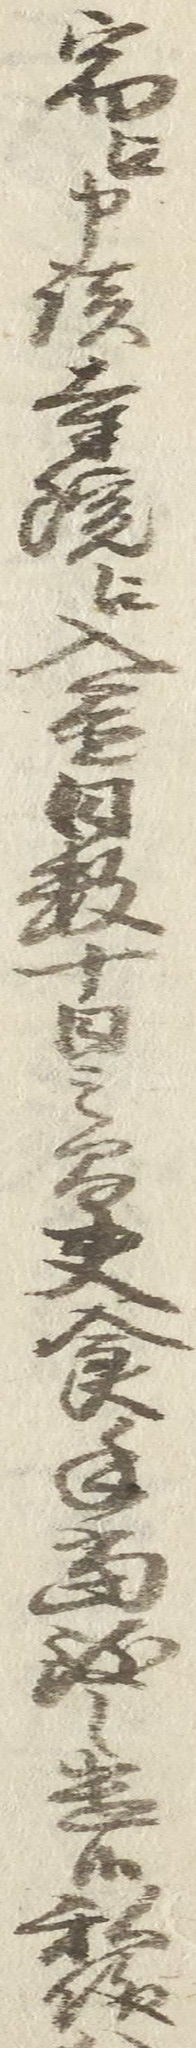宿へ申談寺院江入置日数十日之間夫食手当致し遣候私儀は
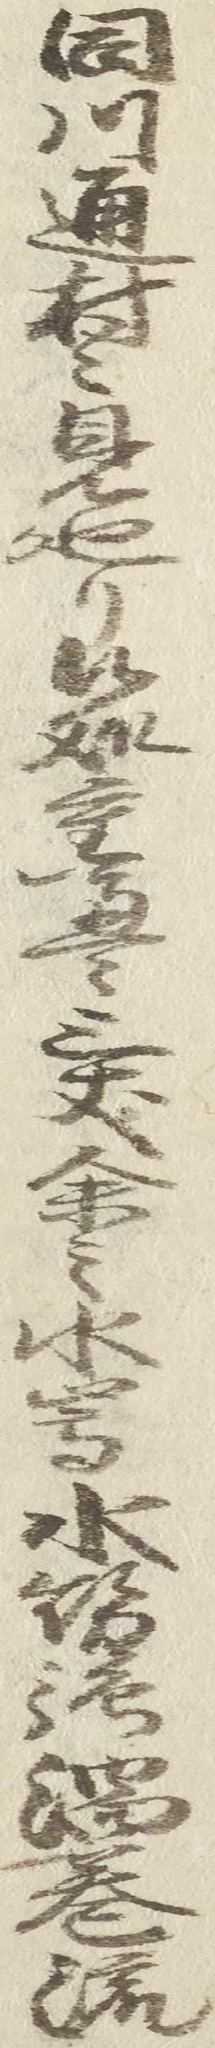同川通村々見廻り候処重畳三丈餘之水嵩水勢強渦巻流

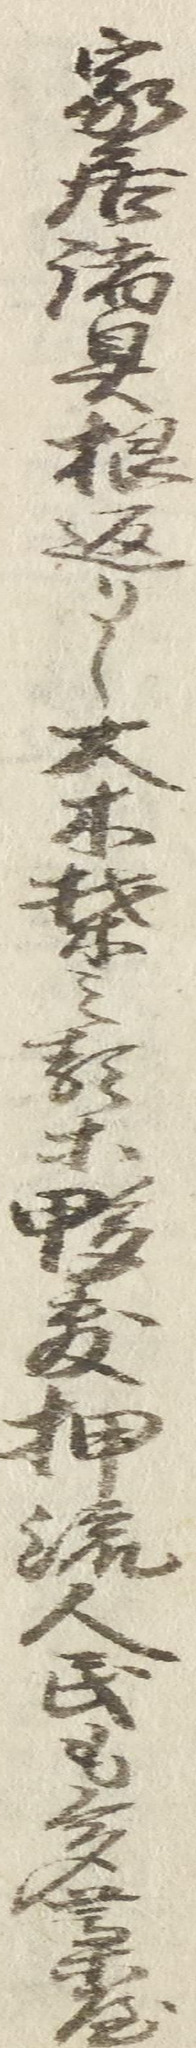家居諸具根返りし大木材木類之等夥敷押流人民も多藁屋
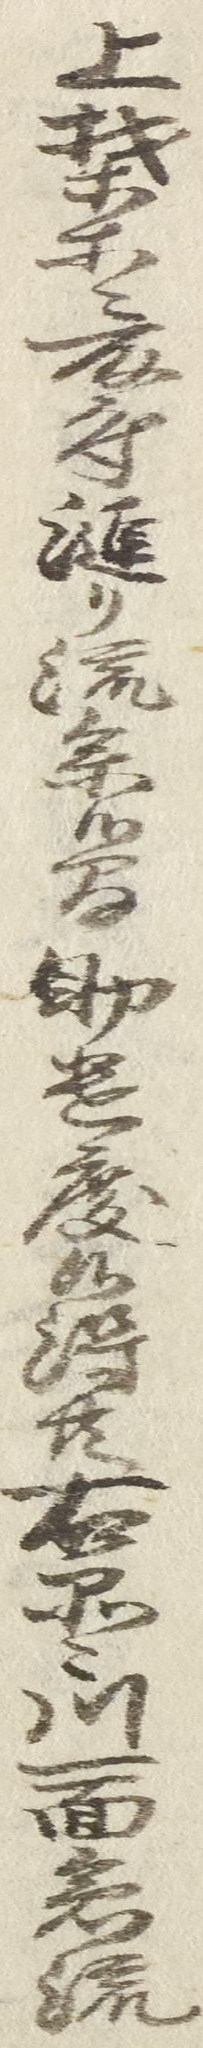上材木等二取付縋り流参り間助遣度候得共右品々川一面急流
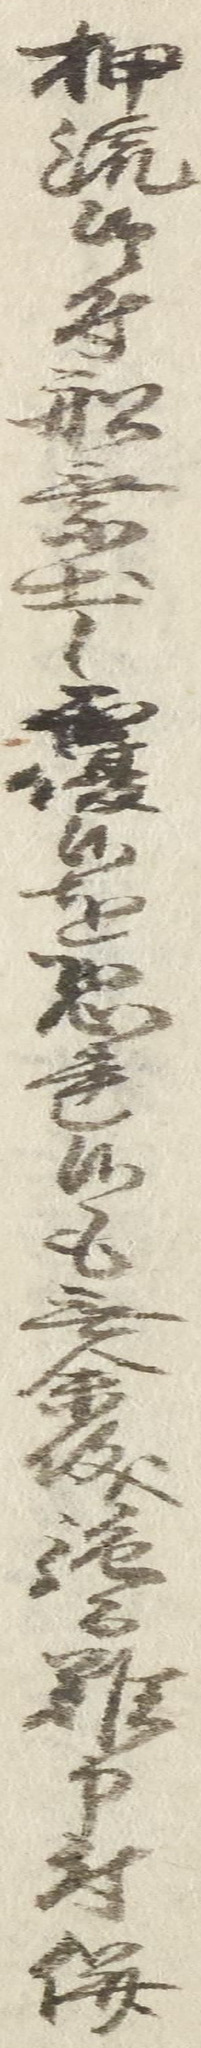押流候付船乗出し覆候を恐れ候も無余儀強而難申付併
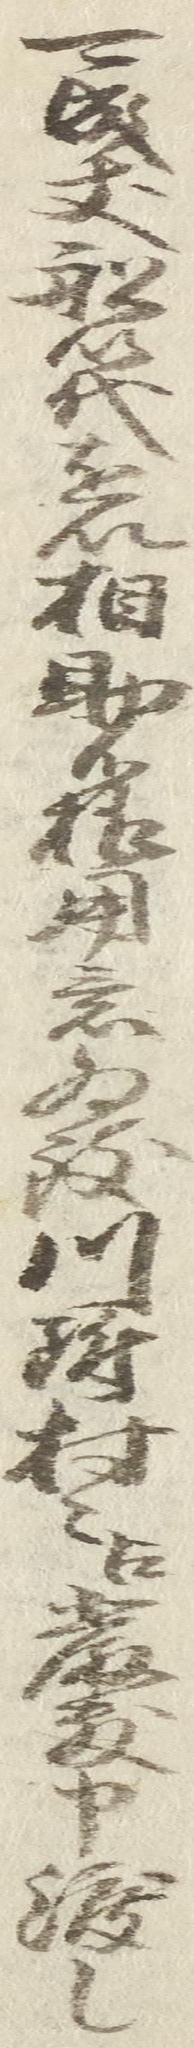可成丈船筏を以相助候様用意為致川附村々江厳敷申渡し
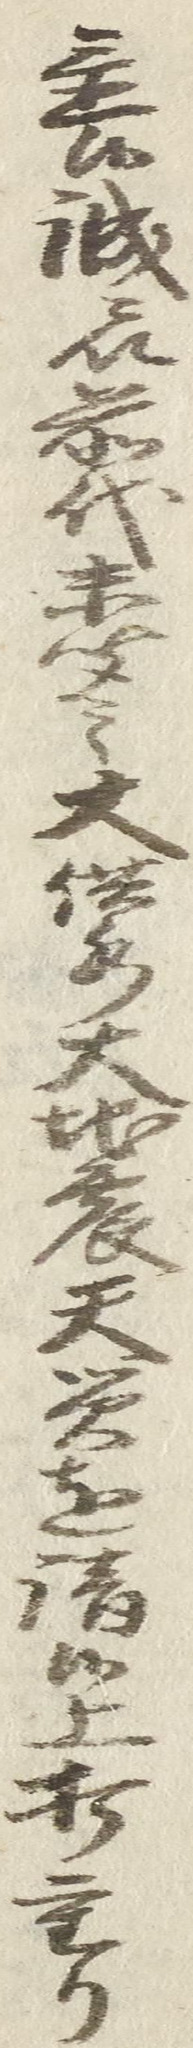置候俄二以前代未聞之大洪水大地震天災を請候上折重り
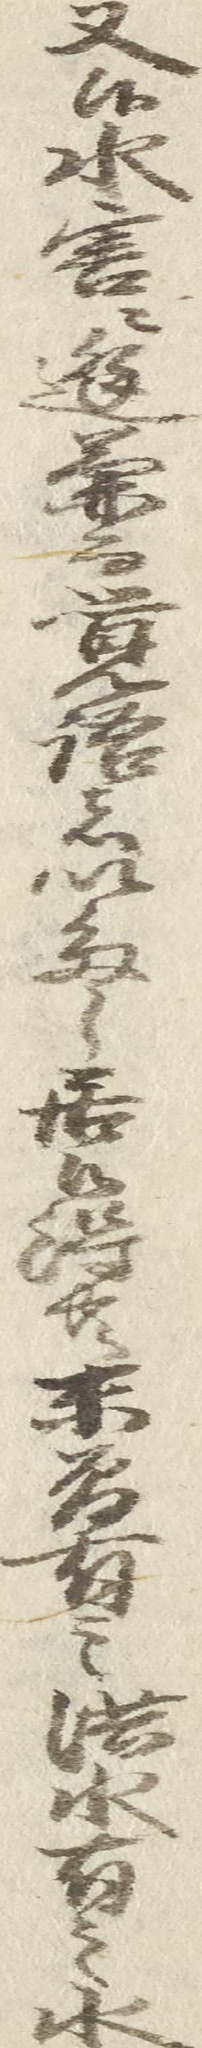又候水災二逢兼々覚悟はいたし居候得共未曾有之洪水有之水
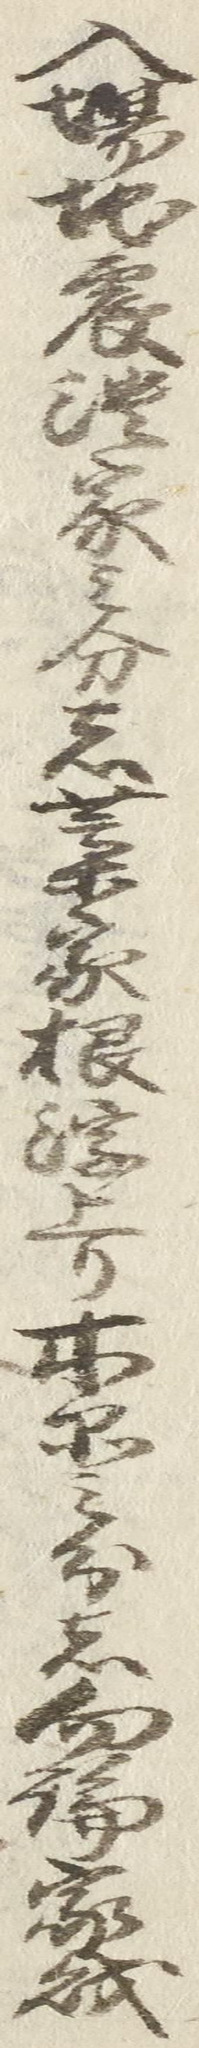入場地震潰家之分は藁家根浮上り木品等之分は勿論家財
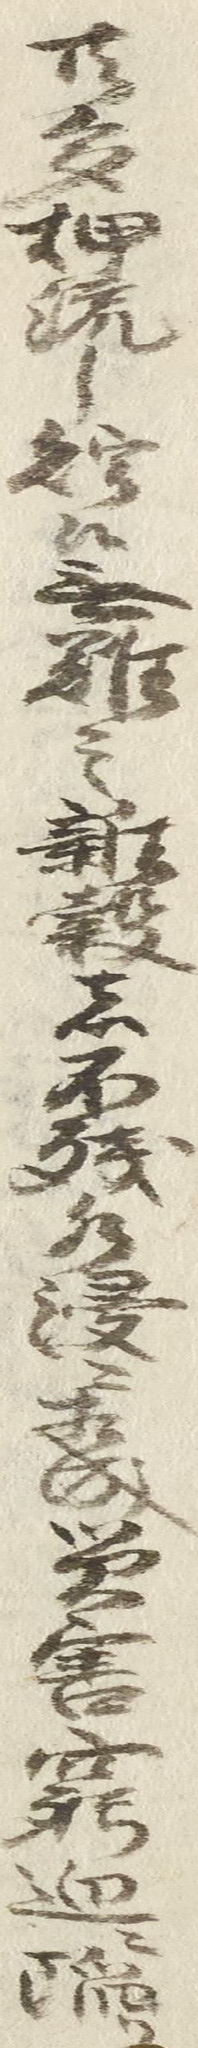共多押流し貯候無難之雑穀は不残水浸二相成災害窮迫二陥
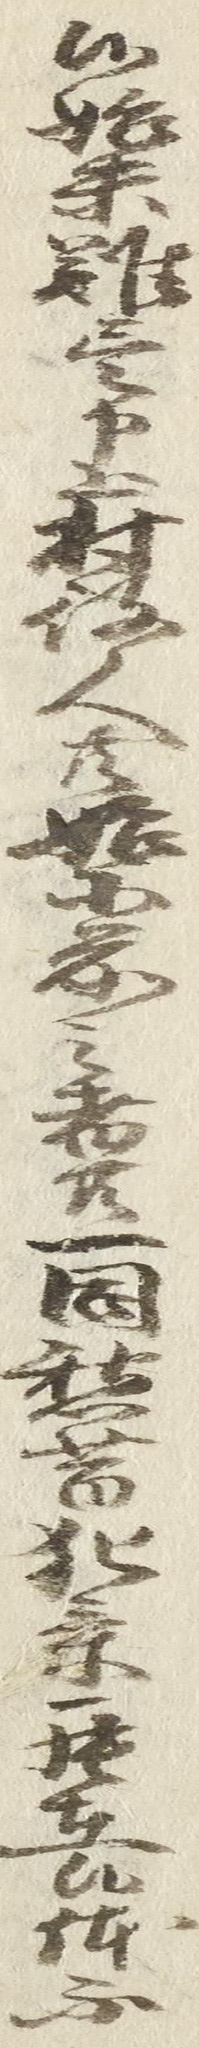候始末難盡申上村役人共始小前之者共一同愁苦狂気罷在候躰不
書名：従往古地震御届書記誌之一
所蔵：東京大学地震研究所図書室 Earthquake Research Institute Library, The University of Tokyo, JAPAN
